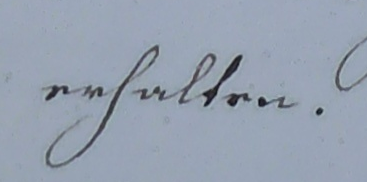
erhalten.
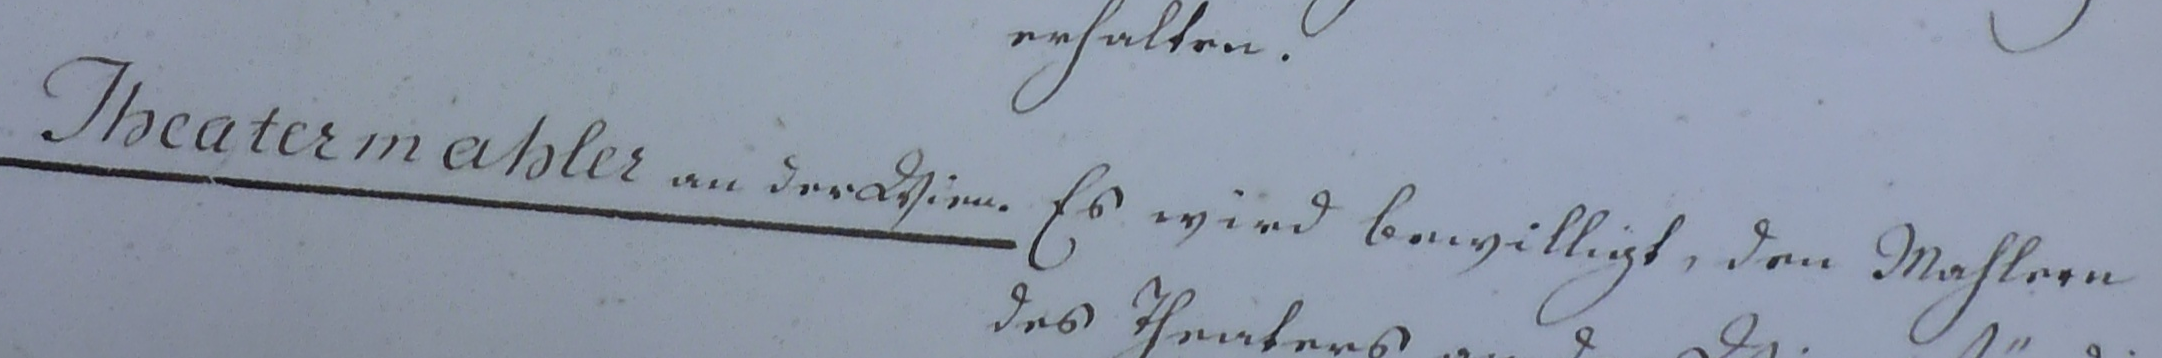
Theatermahler an der Wien. Es wird bewilligt, den Mahlern
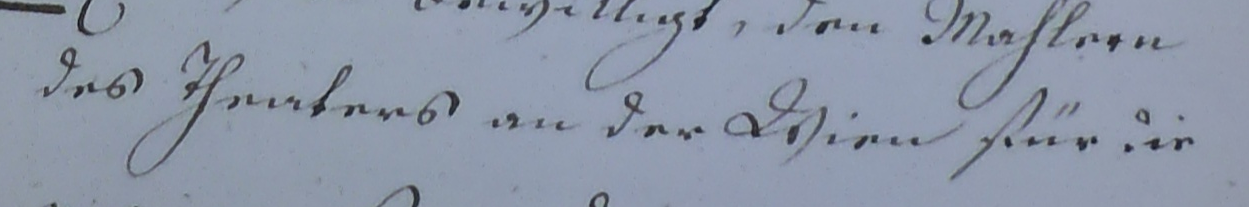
des Theaters an der Wien für die
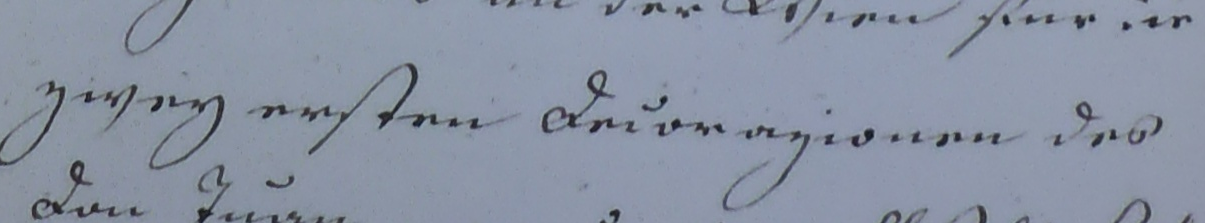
zwey ersten Decorazionen des
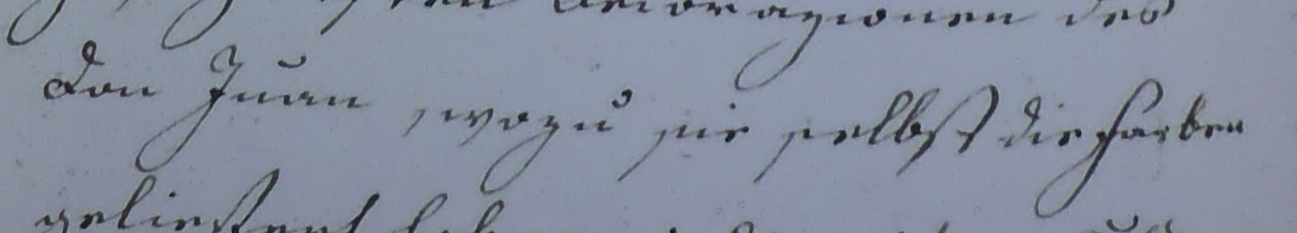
Don Juan, wozu sie selbst die Farben
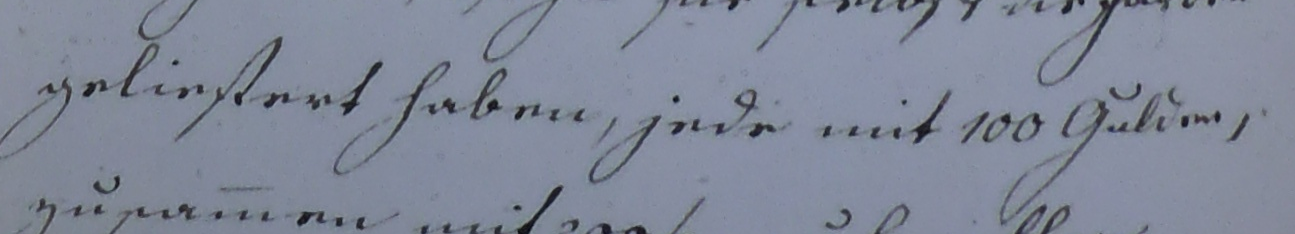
geliefert haben, jede mit 100 Gulden,
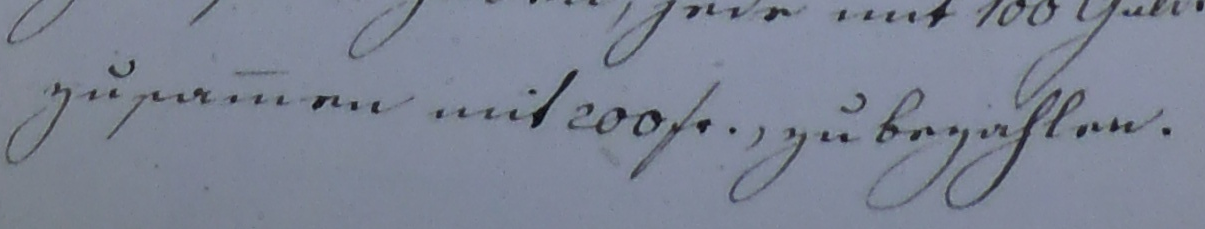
zusam̅en mit 200fr., zu bezahlen.
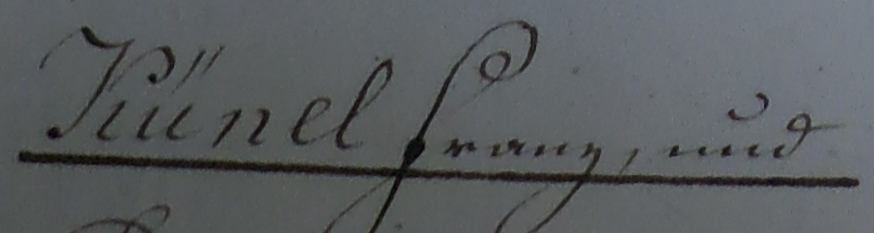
Künel Franz, und
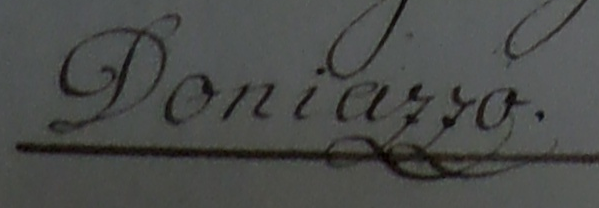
Doniazzo. .. .. .. ..
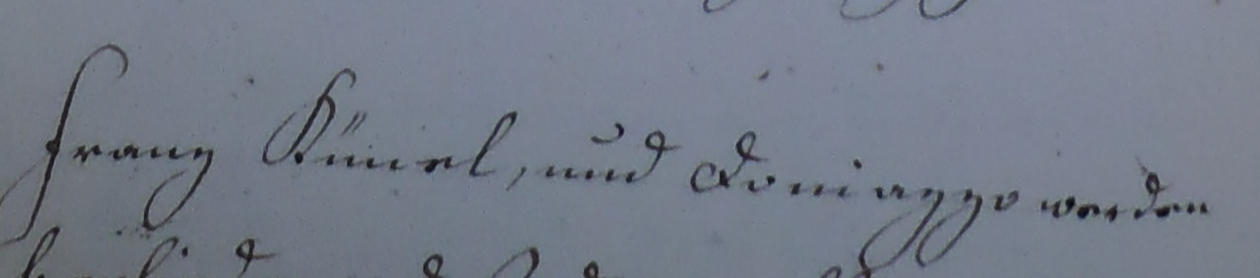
Franz Künel, und Doniazzo werden
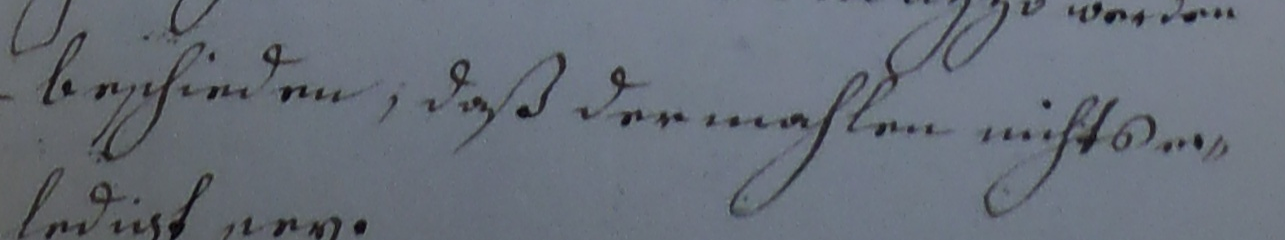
beschieden, daß dermahlen nichts er¬
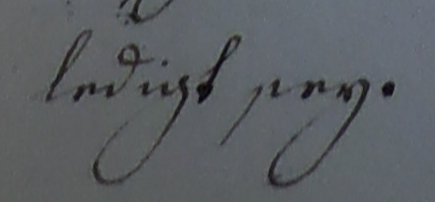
ledigt sey.
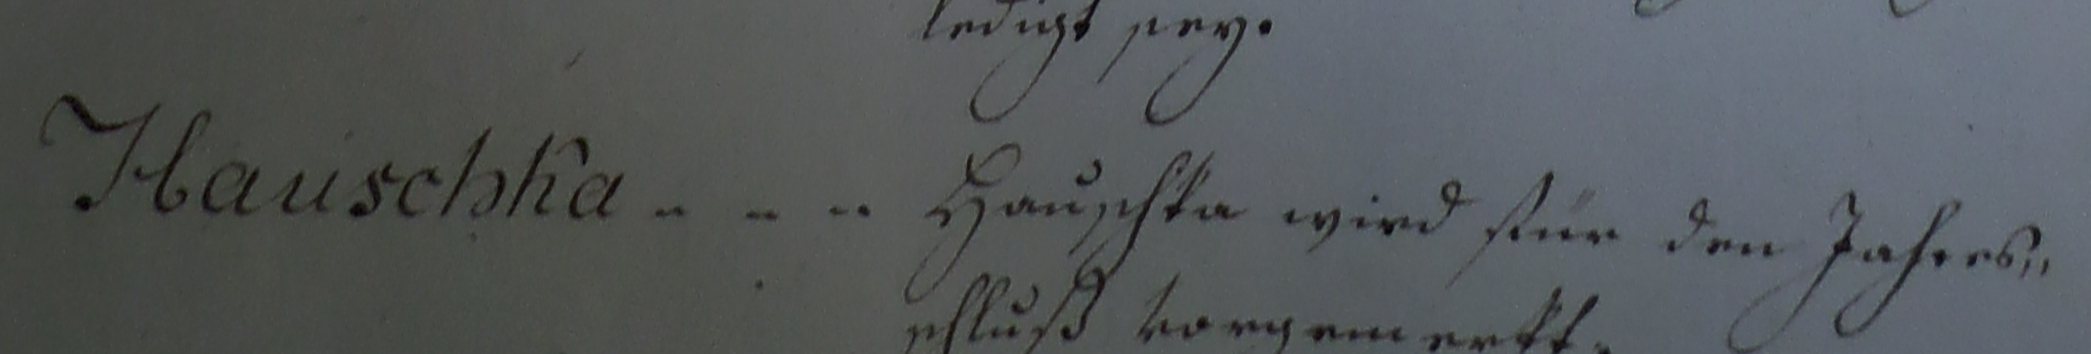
Hauschka .. .. .. Hauschka wird für den Jahres¬
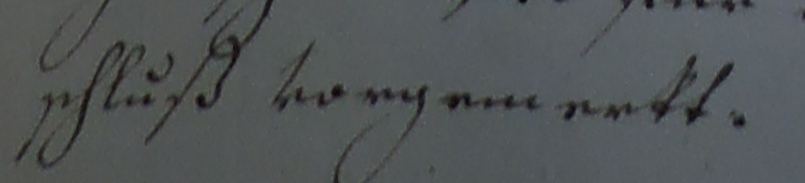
schluß vorgemerkt.
